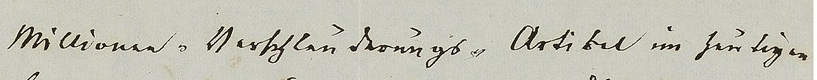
Millionen-Verschleuderungs-Artikel im heutigen
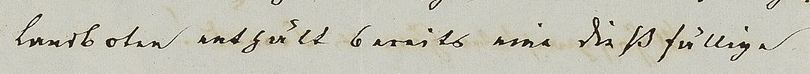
Landboten enthält bereits eine dießfällige
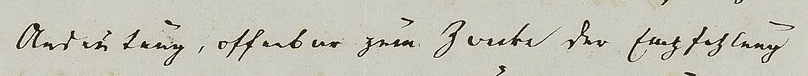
Andeutung, offenbar zum Zwecke der Empfehlung
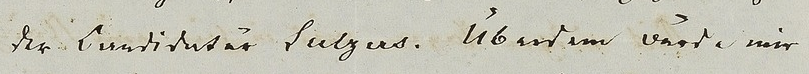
der Candidatur Sulzers. Überdem wurde mir
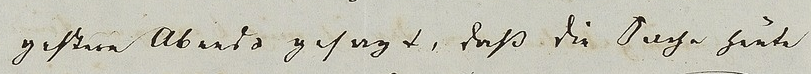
gestern Abends gesagt, daß die Sache heute
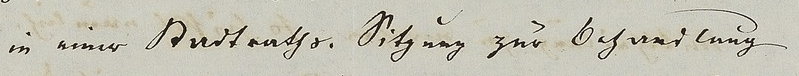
in einer Stadtraths-Sitzung zur Behandlung
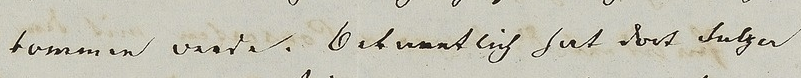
kommen werde. Bekanntlich hat dort Sulzer
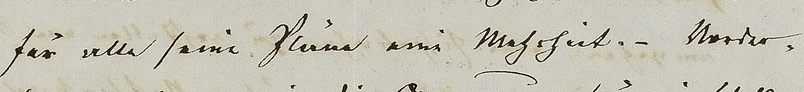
für alle seine Pläne eine Mehrheit. – Vorder-
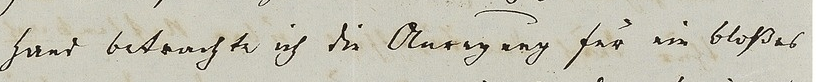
hand betrachte ich die Anregung für ein bloßes
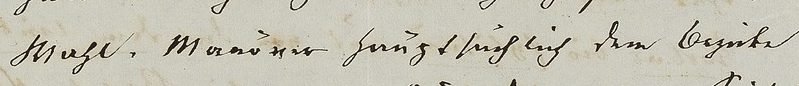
Wahl-Manöver hauptsächlich dem Bezirke
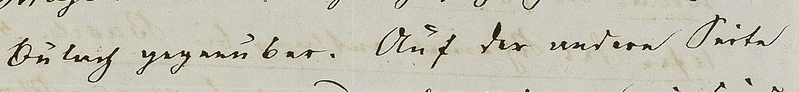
Bülach gegenüber. Auf der andern Seite
